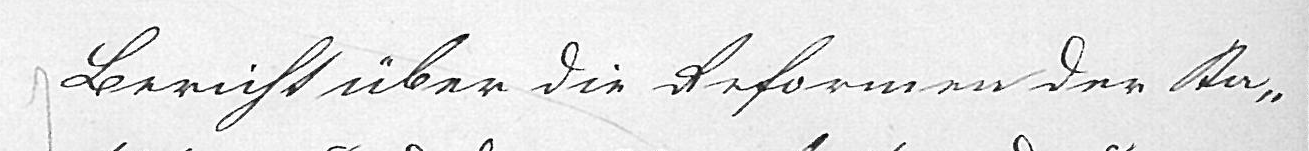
Bericht über die Refornen der Sta-
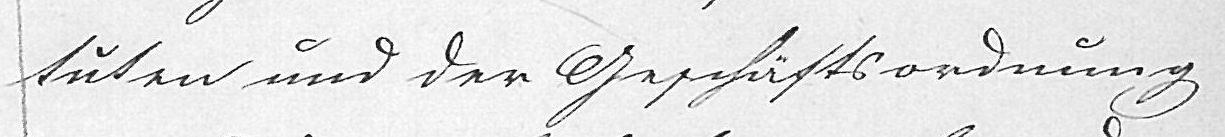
tuten und der Geschäftsordnung
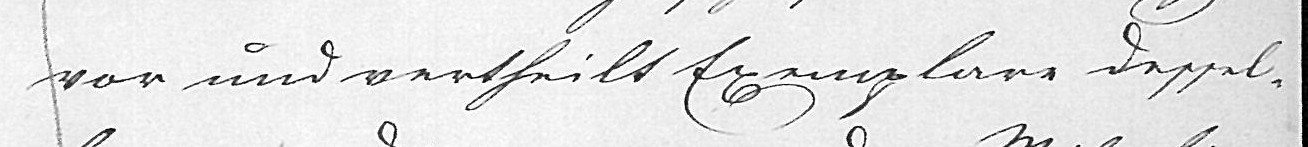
vor und vertheilt Exemplar dessel-
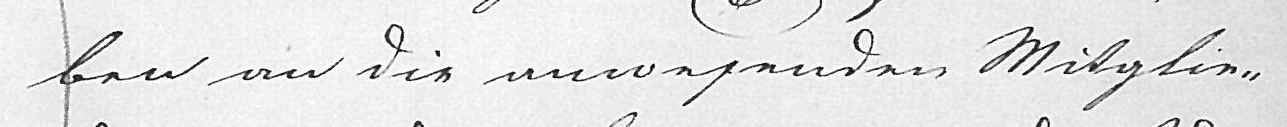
ben an die anwesenden Mitglie-
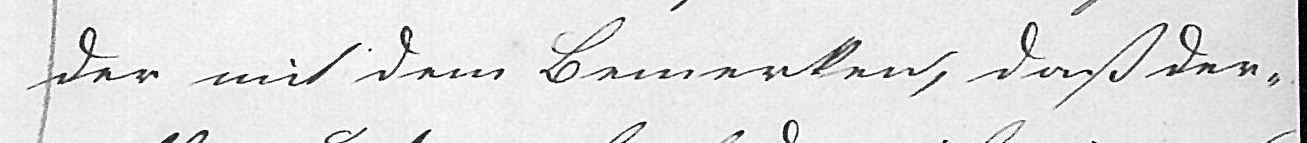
der mit dem Bemerken, daß der-
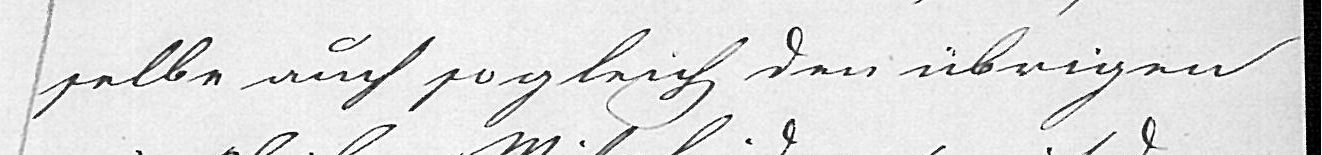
selbe auch sogleich den übrigen
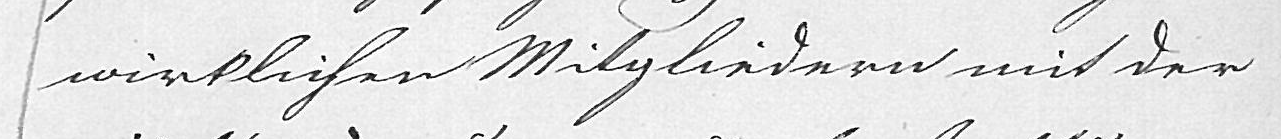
wirklichen Mitgliedern mit der
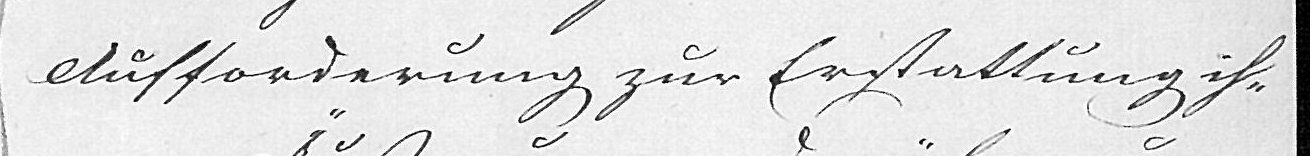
Aufforderung zur Erstattung ih-
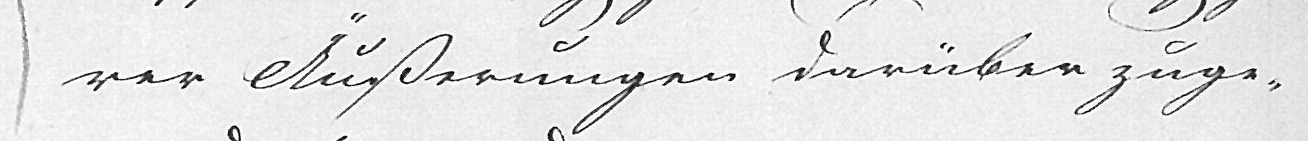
rer Äußerungen darüber zuge-
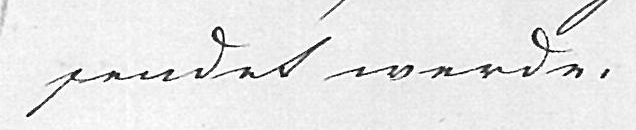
sendet werde.
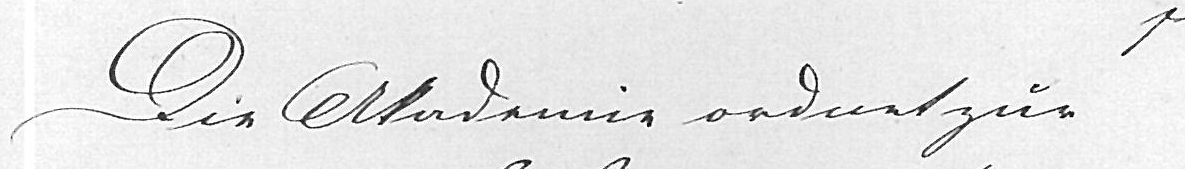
Da Akademie ordnet zur
